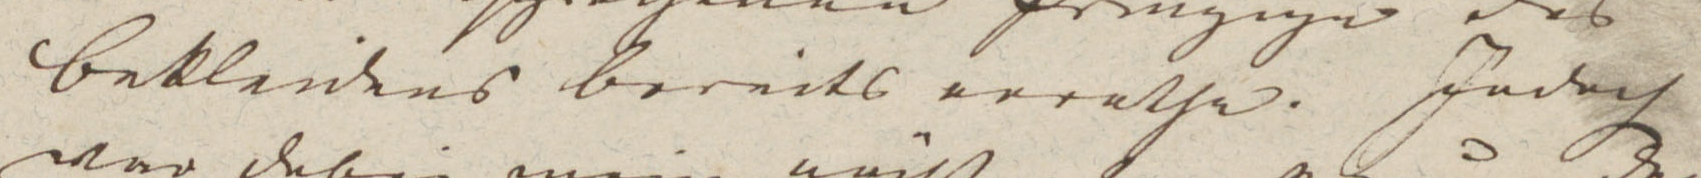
Bekleidens bereits errathe. Jedoch
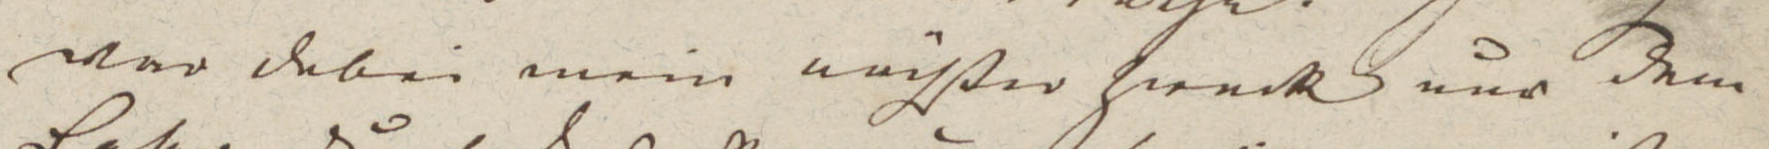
war dabei mein nächster Zweck nur dem
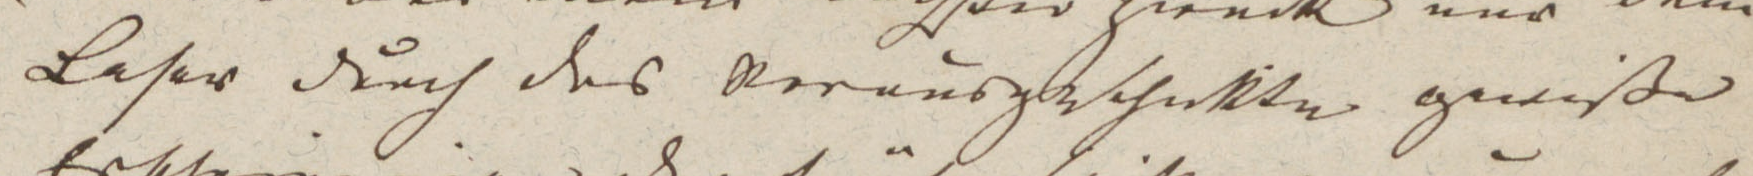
Leser durch das vorausgeschickte gewisse
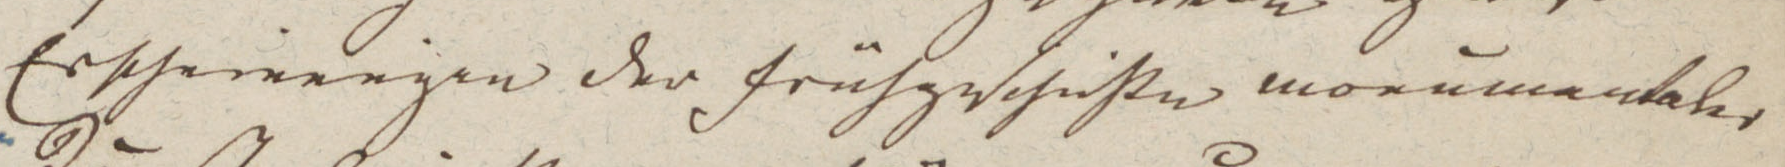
Erscheinungen der Frühgeschichte monumentaler
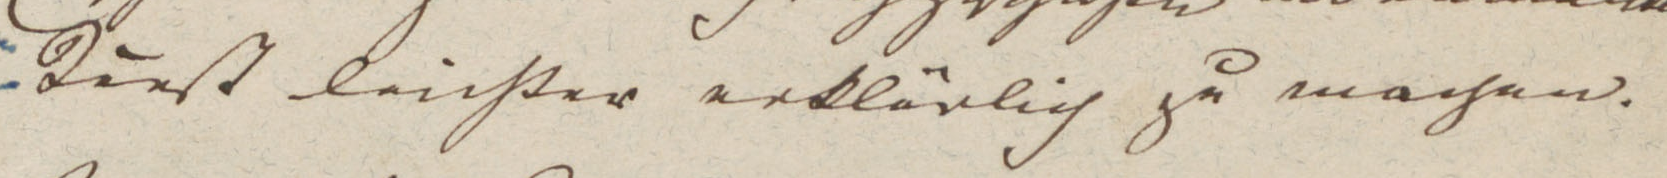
Kunst leichter erklärlich zu machen.
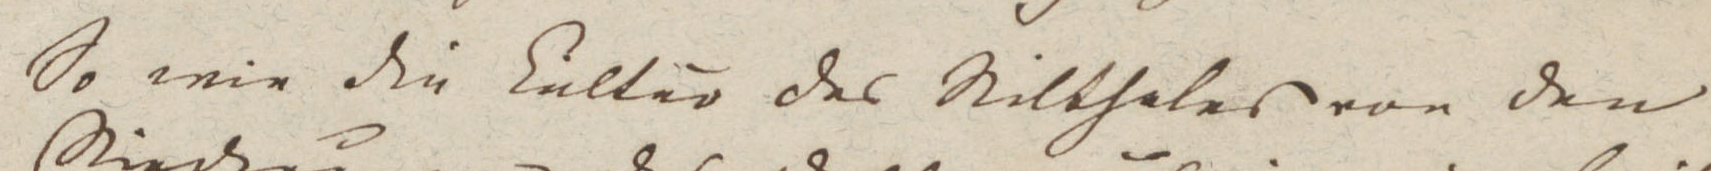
So wie die Cultur des Nilthales von den
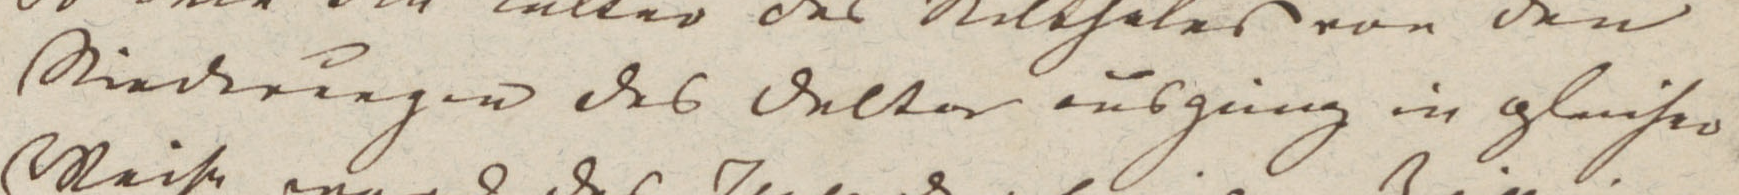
Niederungen des Delta ausging in gleicher
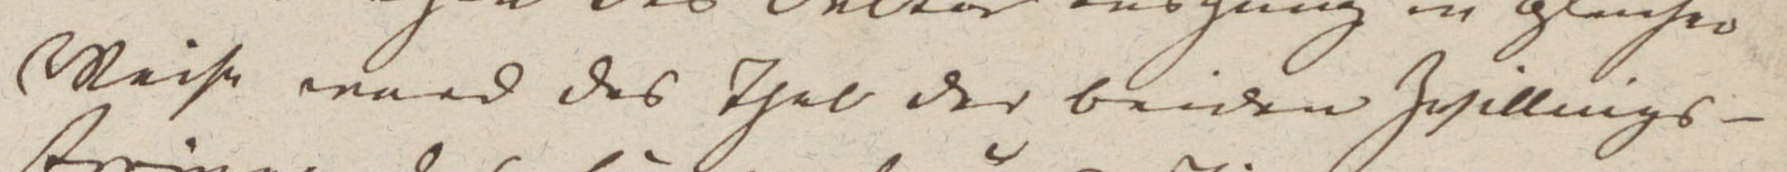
Weise ward das Thal der beiden Zwillings-
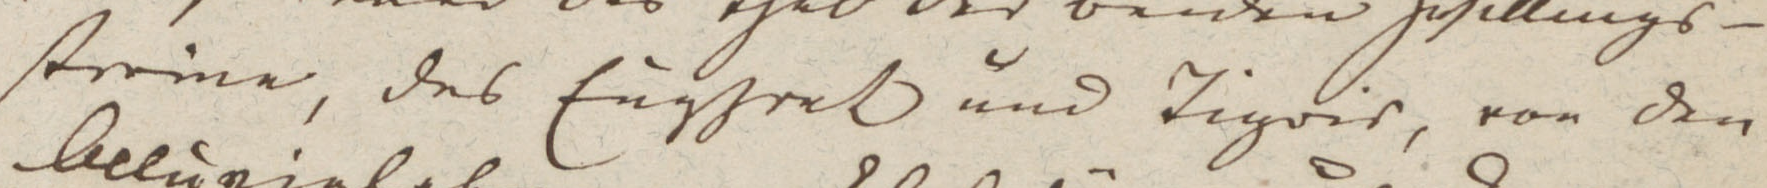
ströme, des Euphrat und Tigris, von den
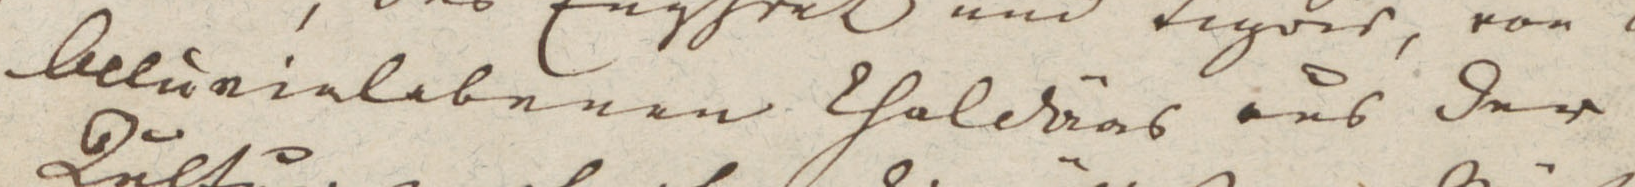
Alluvialebenen Chaldäas aus der
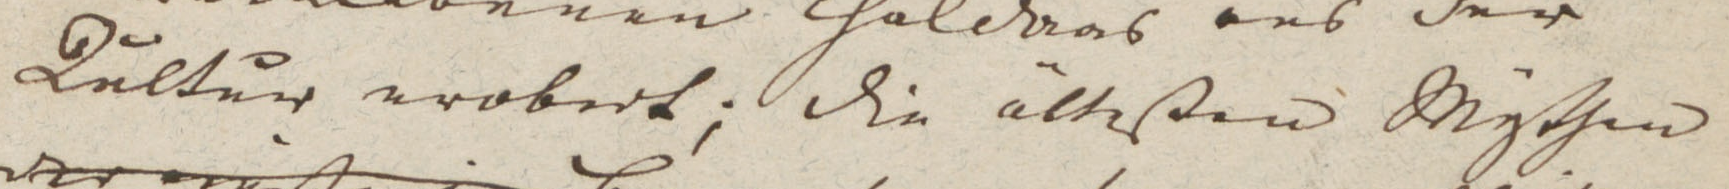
Kultur erobert; Die ältesten Mythen
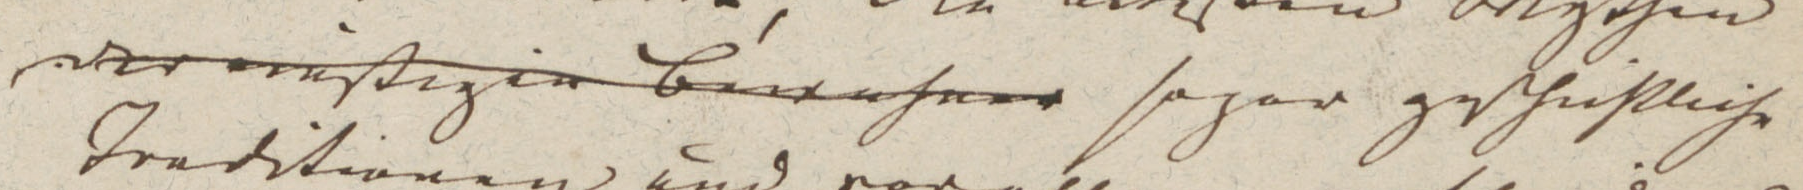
der einstigen Bewohner sogar geschichtliche
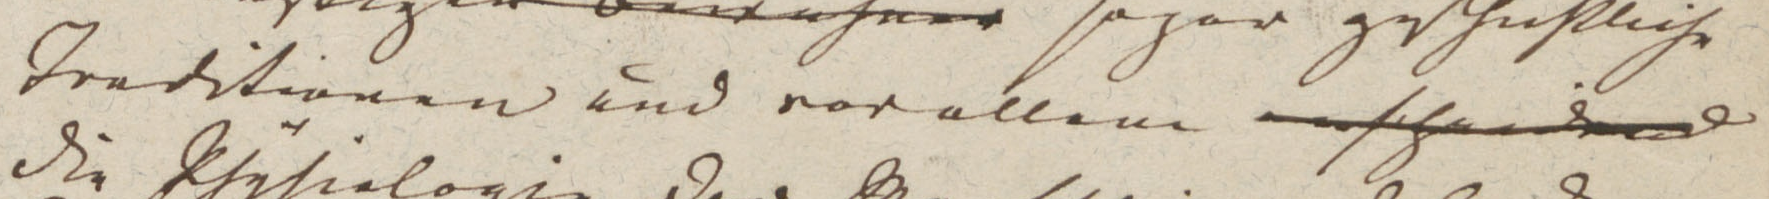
Traditionen und vor allem entscheidend
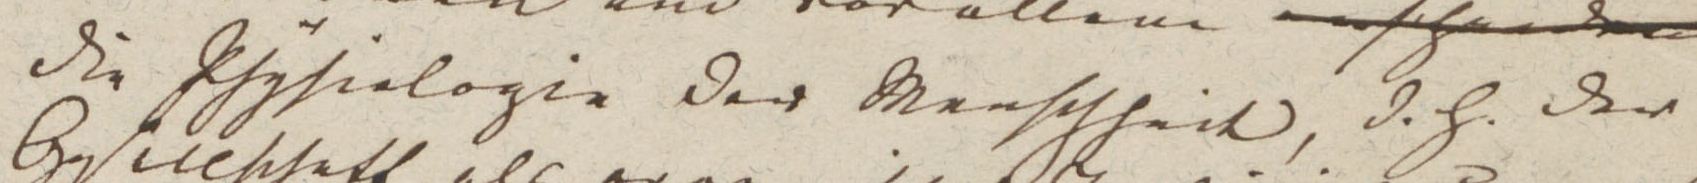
die Physiologie der Menschheit, d. h. der
